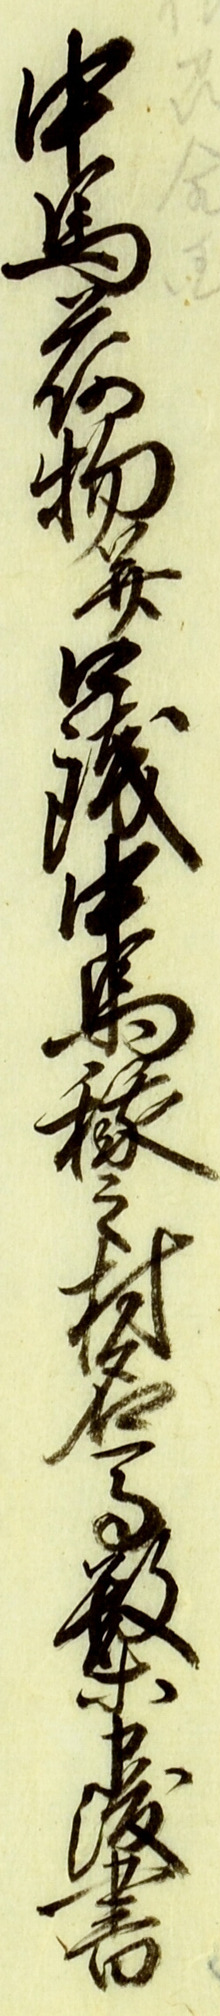中馬荷物并口銭中馬稼之村名馬数等申渡書
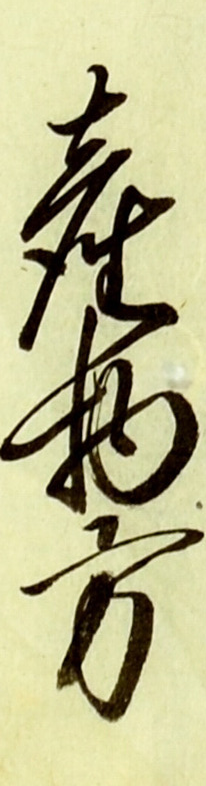産物方

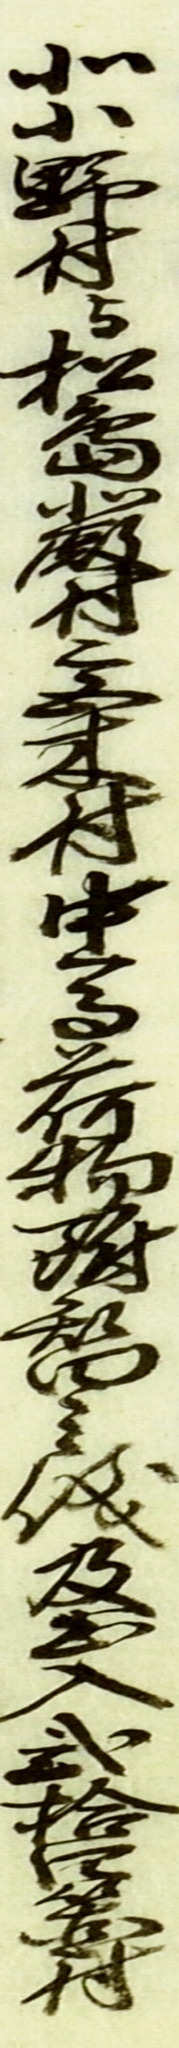北小野村与松島巌村宮木村中馬荷物附替之儀及出入弐拾四箇村
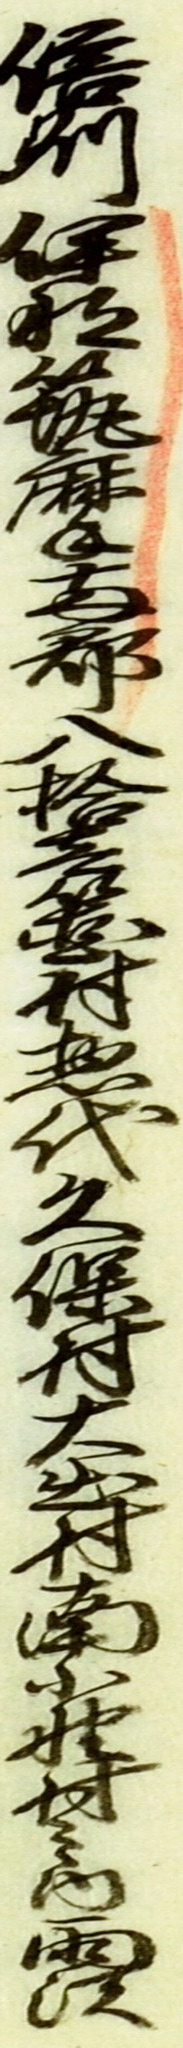信州伊那筑摩両郡八拾三箇村惣代久保村大出村南小野村之内雨沢
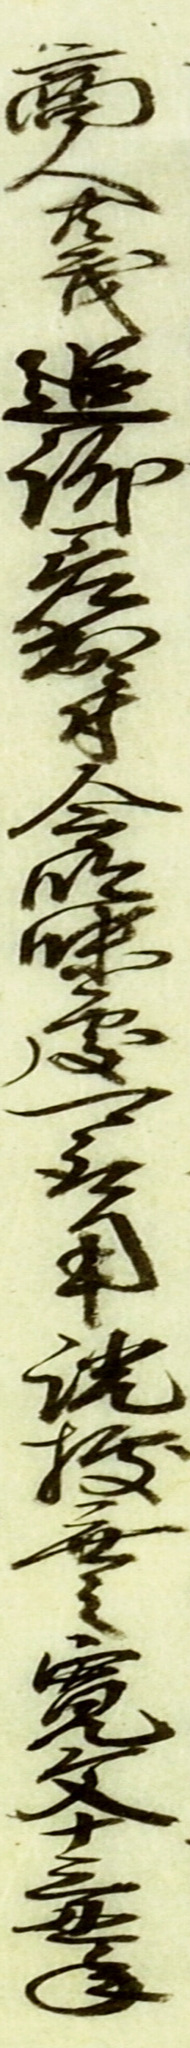商人共茂追訴差出ニ付令吟味処可取用証拠無之寛文十三丑年
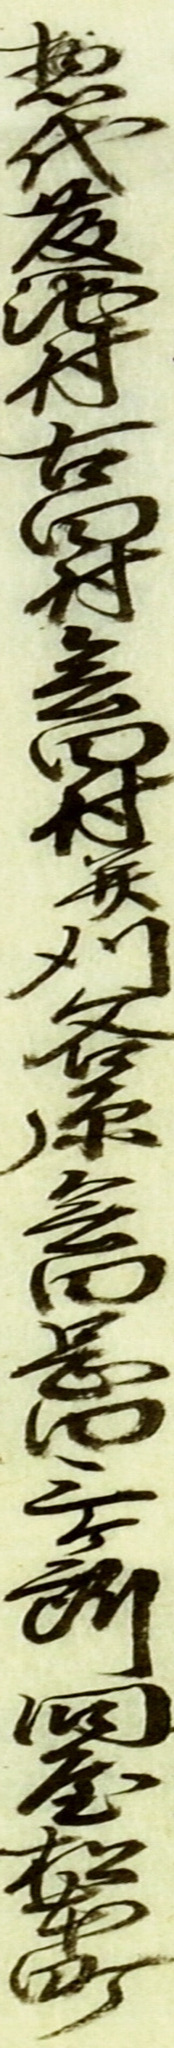惣代藤池村古田村会田村并刈吝原会田岡田三ヶ所問屋松本町
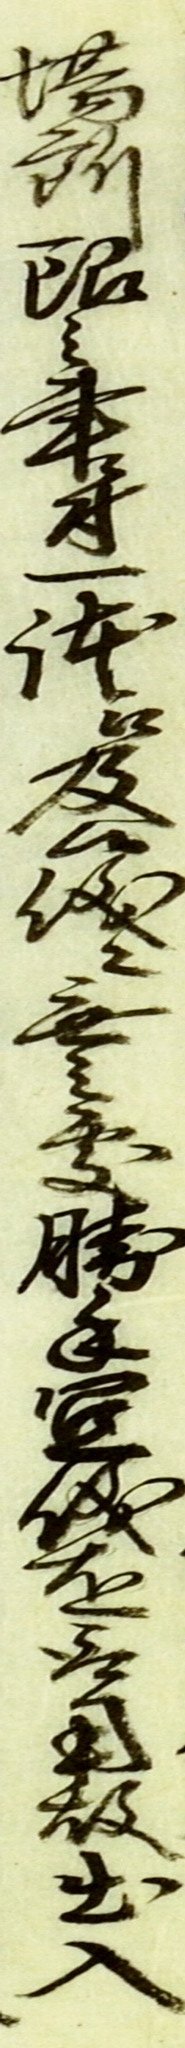場所限之事ニ付一体江及候儀ニ無之処勝手宜儀を取用故出入
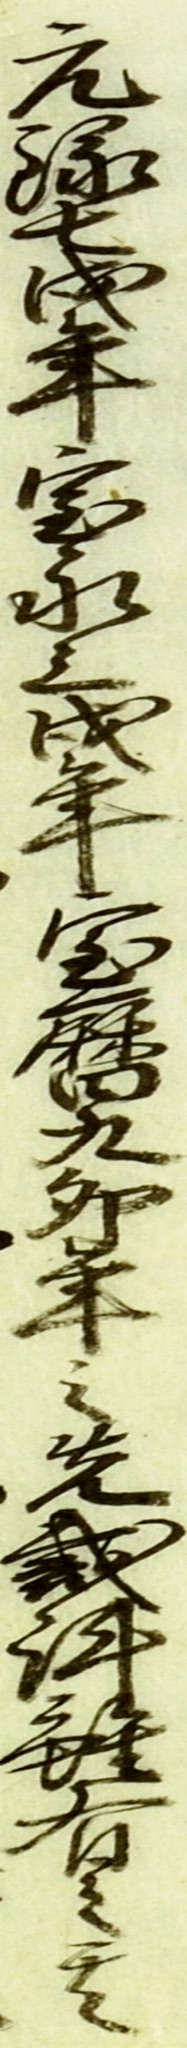元禄七戌年宝永三戌年宝暦九卯年之先裁許難有之其
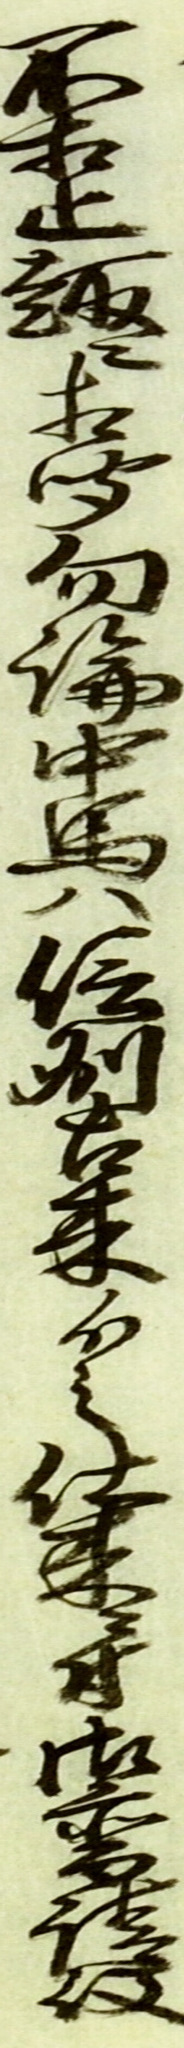不相止趣ニ相聞勿論中馬ハ信州古来ゟ之仕来ニ付御普請役
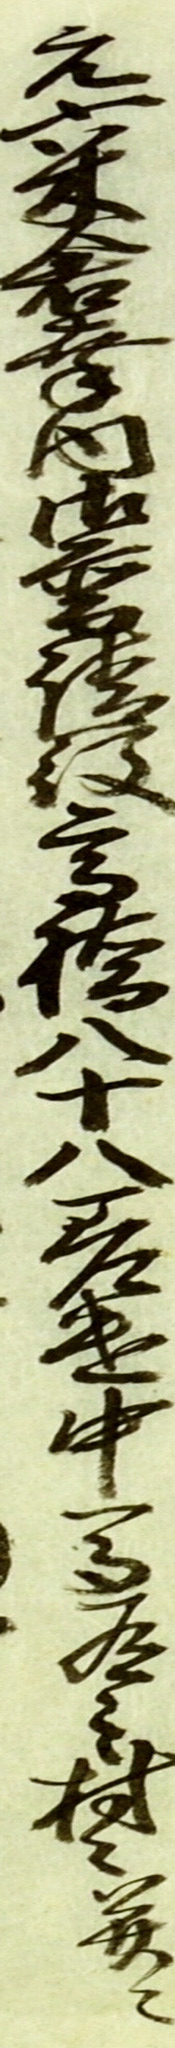元〆米倉幸内御普請役高橋八十八差遣中馬有之村々并ニ
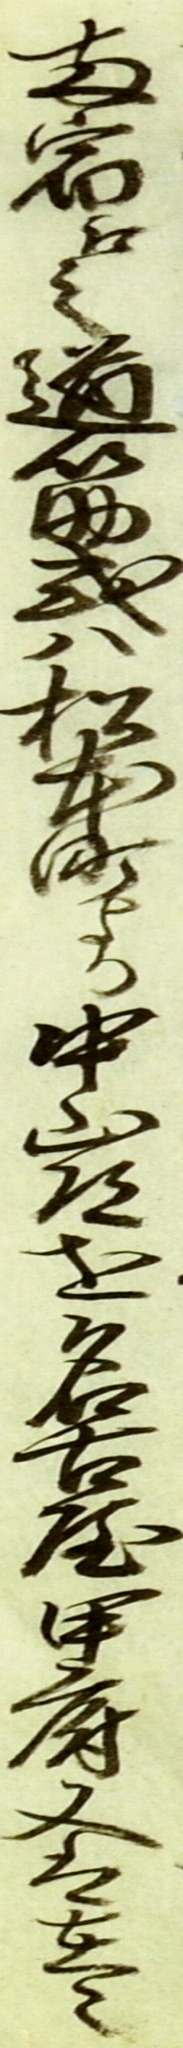両宿江之道筋或ハ松本町より中山道を名古屋甲府又は在之
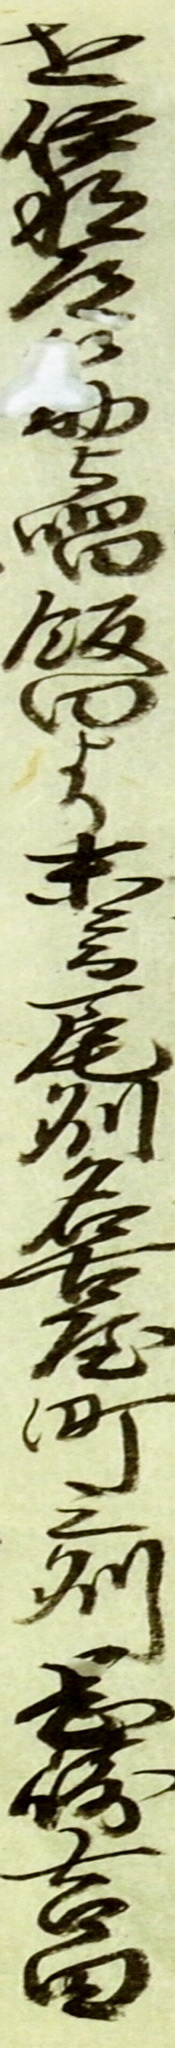を伊那道筋与唱飯田より末ニ而尾州名古屋町三州岡崎吉田
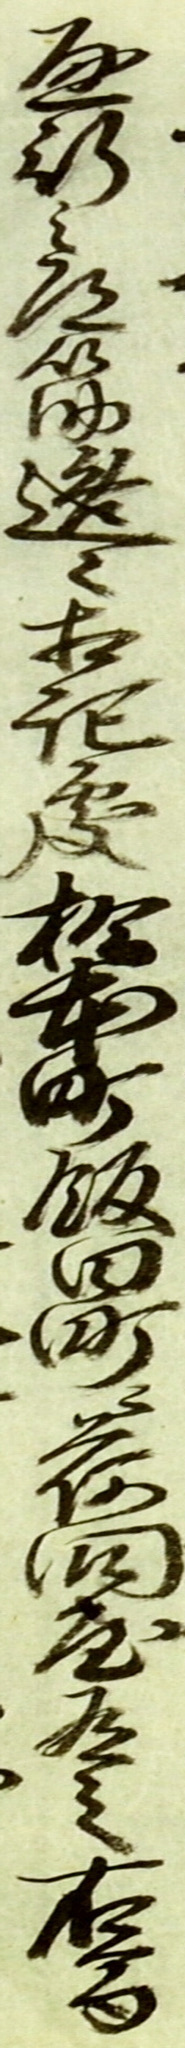通行之道筋逸々相記処松本町飯田町ニ荷問屋有之右間
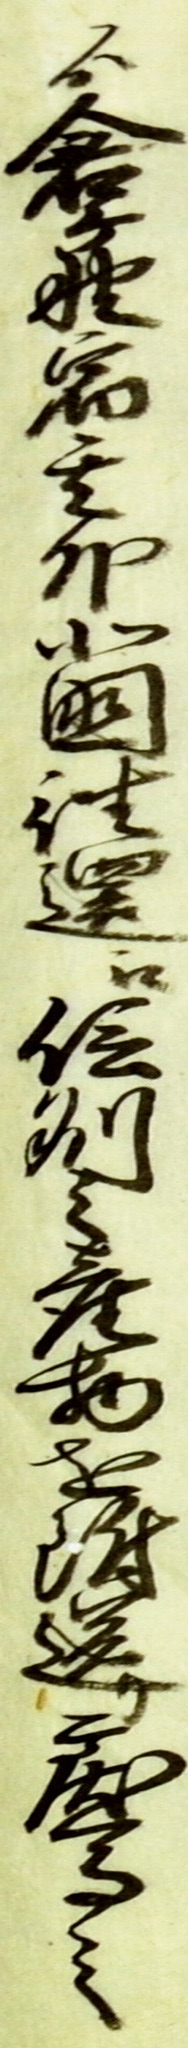ゟ倉ヶ野宿其外北国往還江信州之産物を附送り戻午馬之

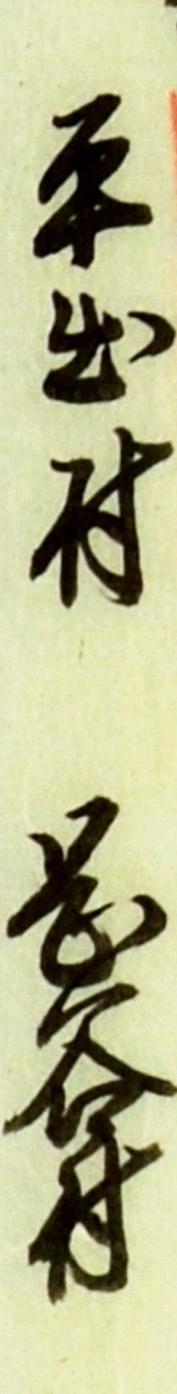平出村岡谷村
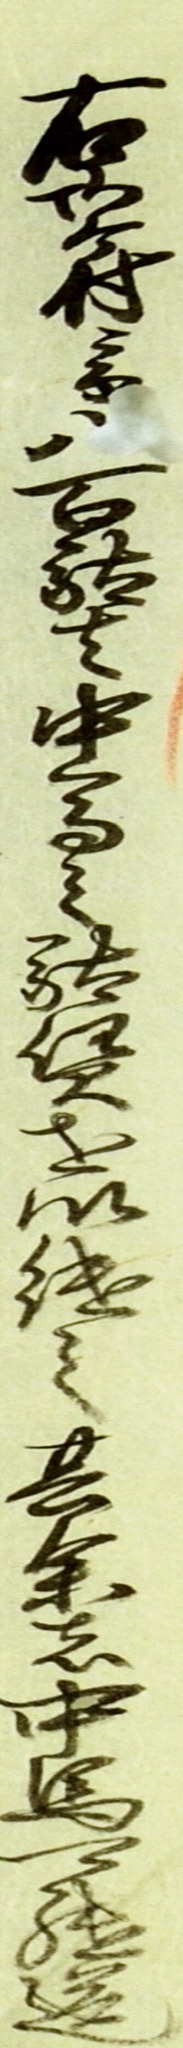右弐ヶ村ニ而八百駄者中馬之駄賃を以継之其余者中馬可継送
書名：中馬荷物并口銭中馬稼之村名馬数等申渡書
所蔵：伊那市立高遠町図書館・合同会社AMANE
